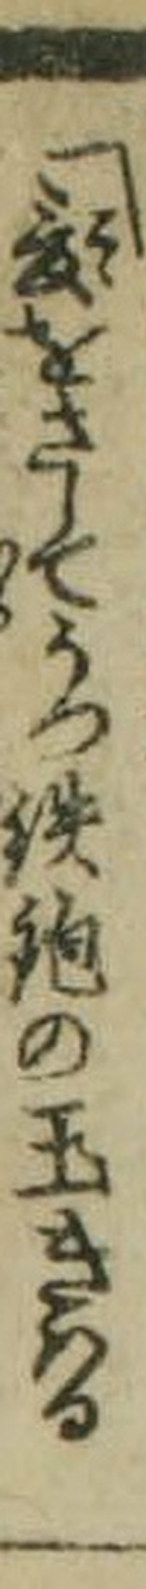〽爰をさしてうつ鉄鉋の玉きはる
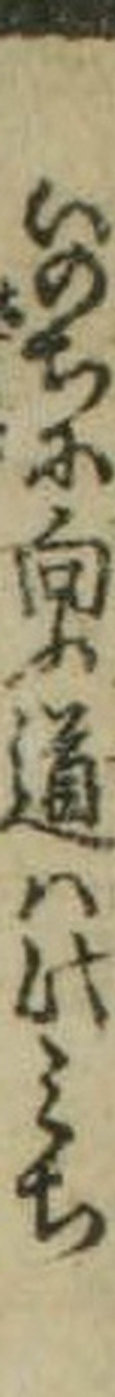いのちに向ふ道は此みち
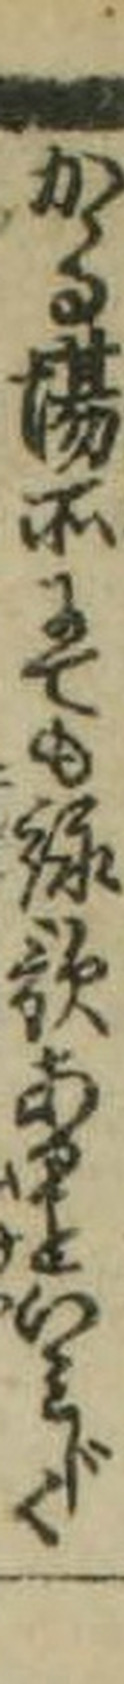かゝる場所にても詠歌あることいみじく
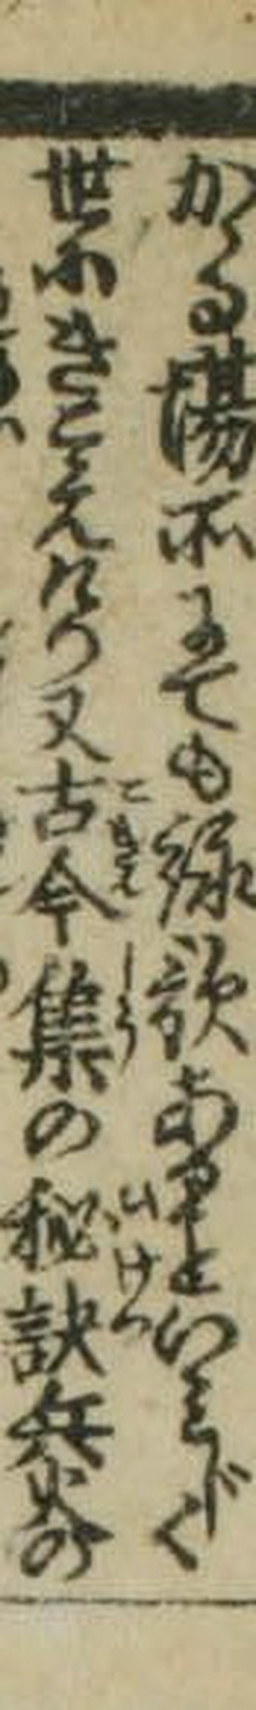世にきこえけり又古今集の秘訣兵火の
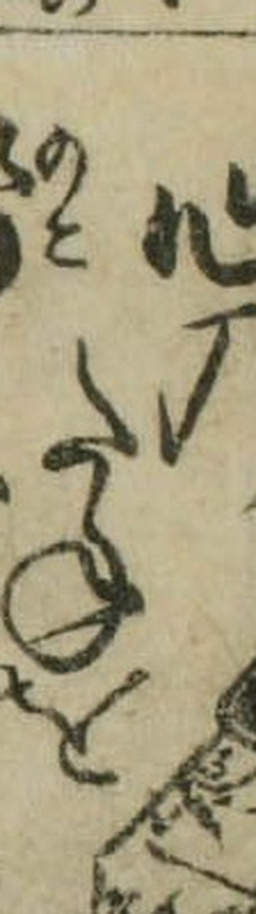たねを
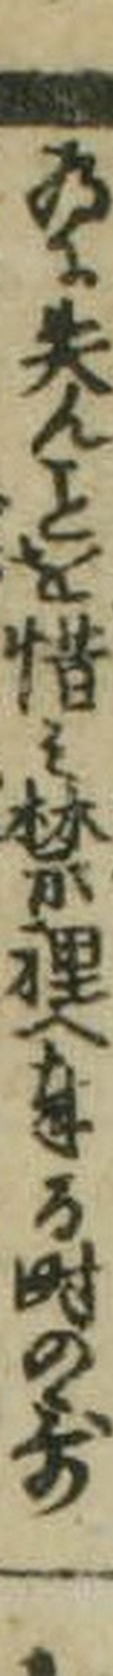為に失んことを惜み禁裡へ奉る時の哥
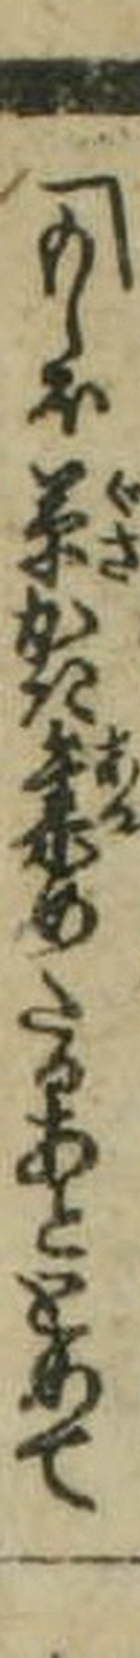〽もしほ草かき集めたるあととめて
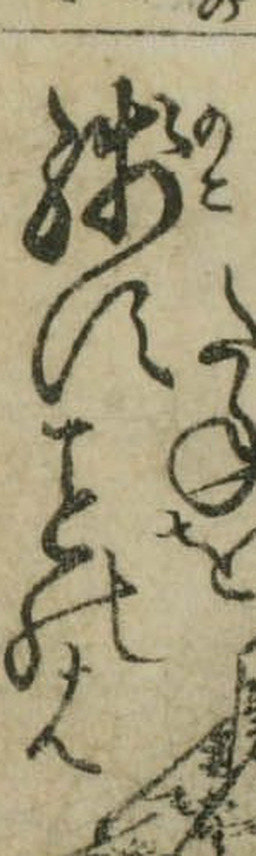残すことのは
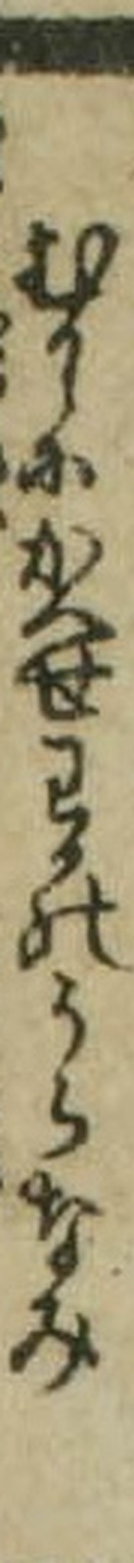むかしにかへせわかのうらなみ
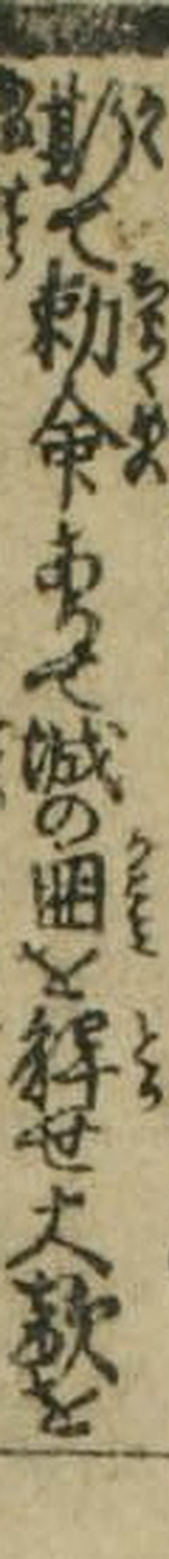斯て勅命ありて城の囲を解せ大歒を
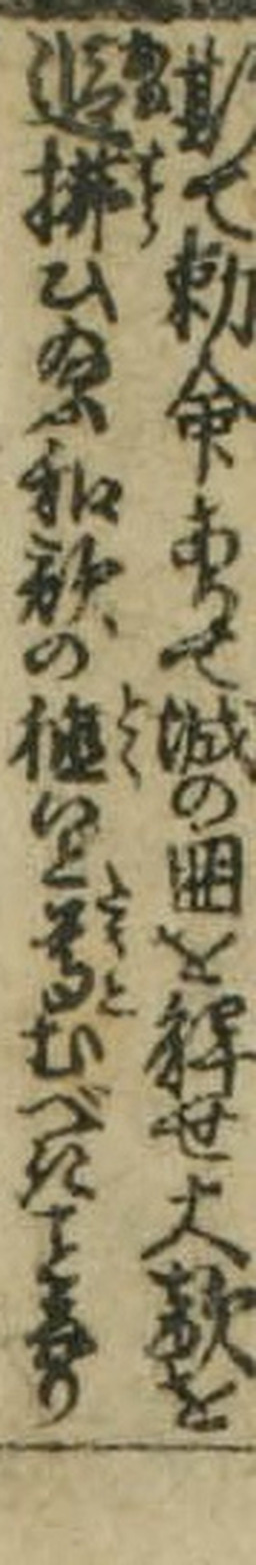追払ひ給ふ和歌の徳いと尊むべきことなり
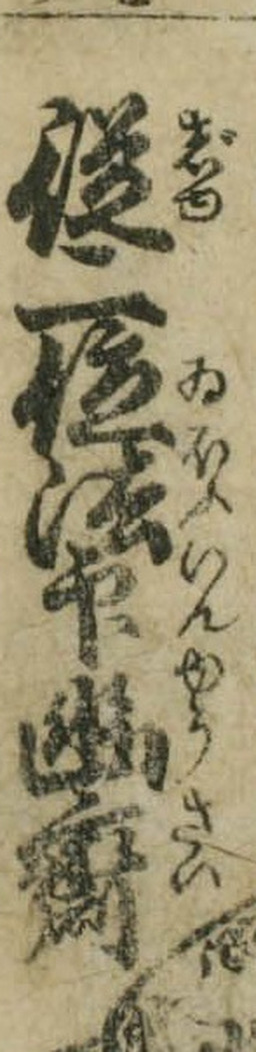従二位法印幽斎
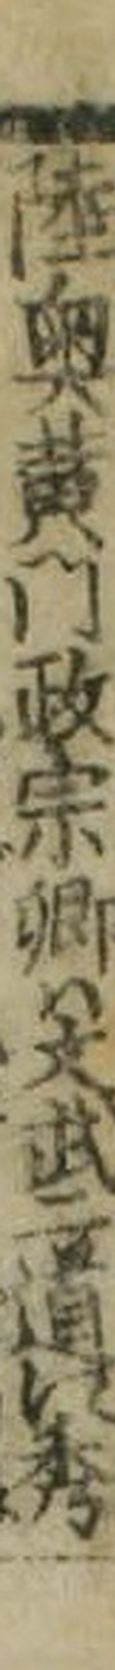陸奥黄門政宗卿は文武二道に秀
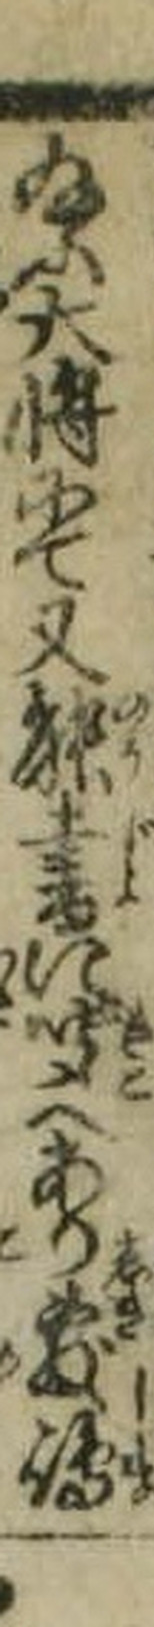給ふ大将にて又能書に聞へあり敷嶋
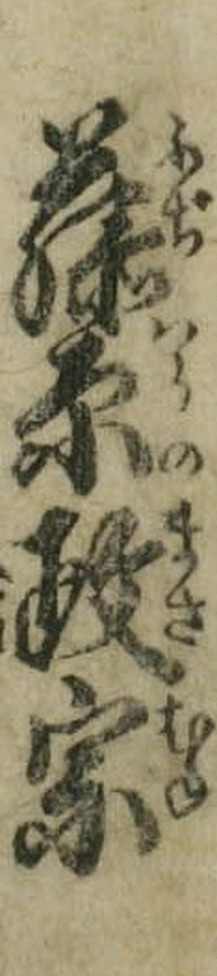藤原政宗
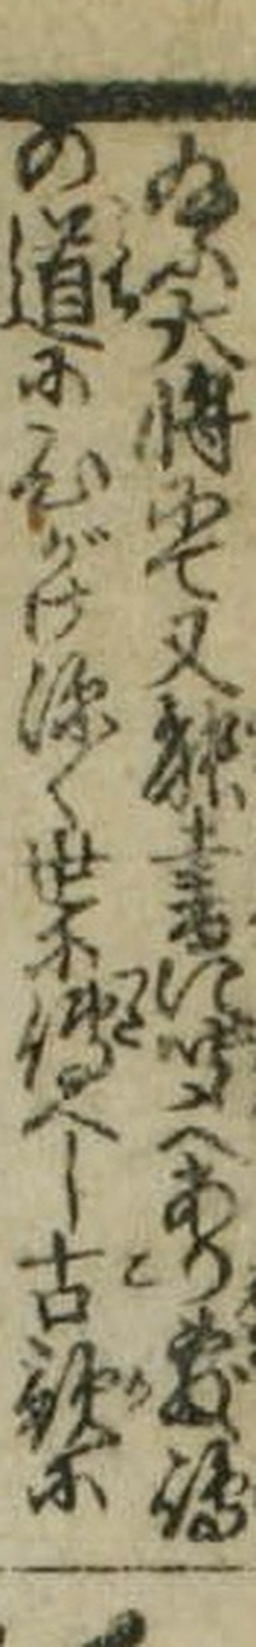の道に心がけ深く世に伝へし古歌に
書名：續英雄百人一首
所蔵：東京学芸大学附属図書館
